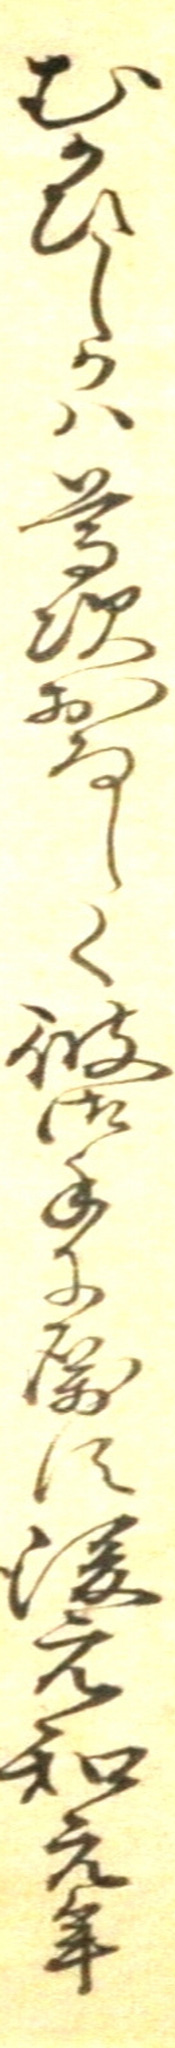むかひしかは尊次おなしく彼御手に属す後元和元年
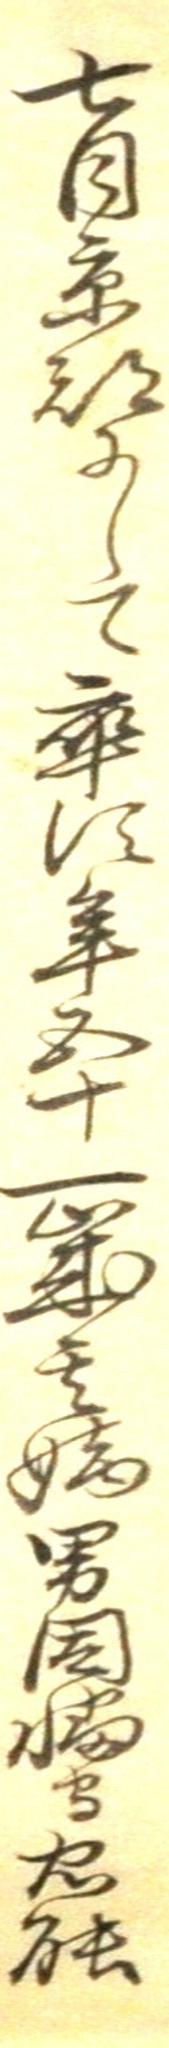七月京都にして卒す年五十一歳其嫡男因幡守忠能
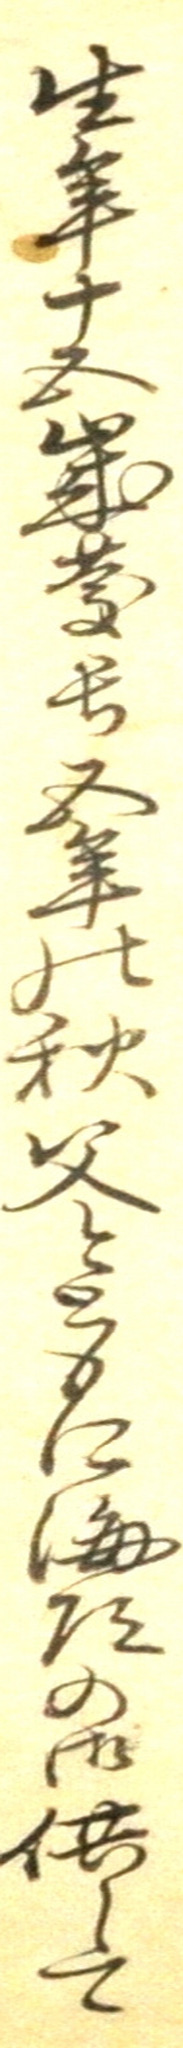生年十五歳慶長五年の秋父とともに海道の御供して
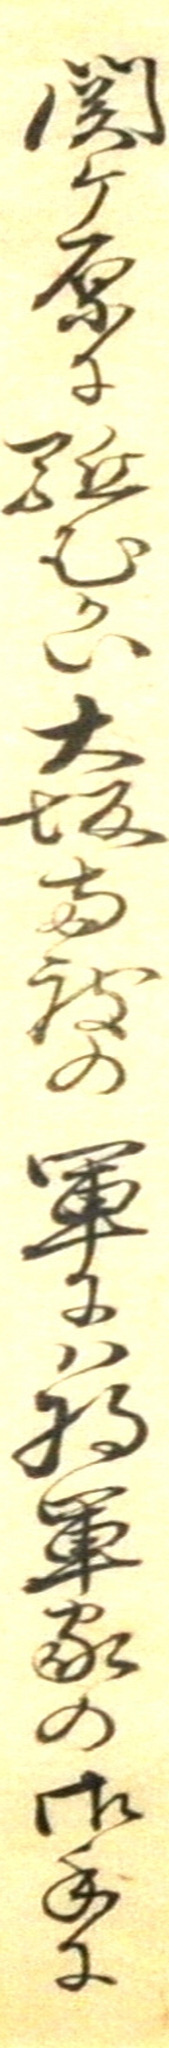関ヶ原に駈むかい大坂両度の軍には将軍家の御手に
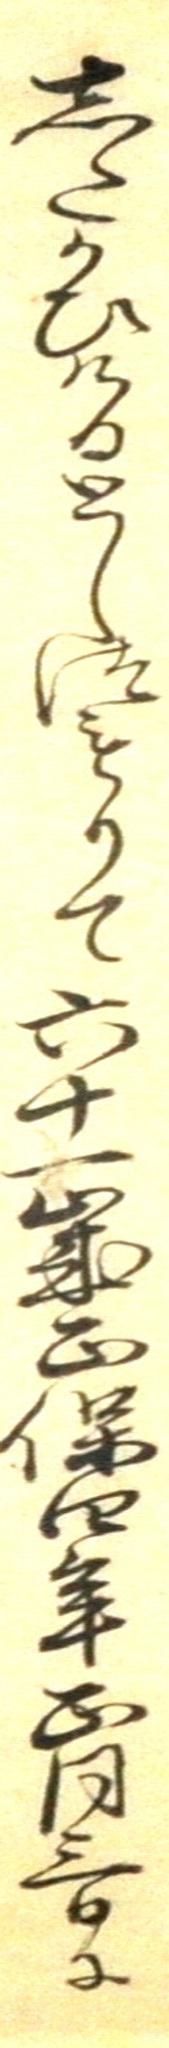したかひけるとしつもりて六十一歳正保四年正月三日に
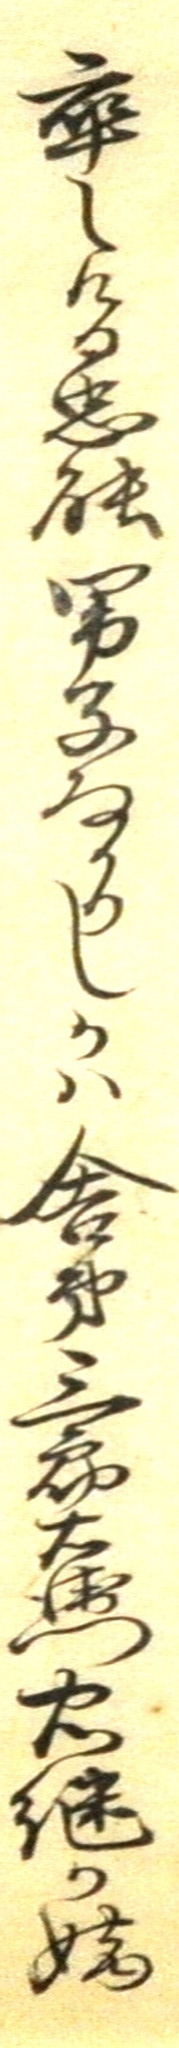卒しける忠能男子なかりしかは舎弟三郎右衛門忠継か嫡
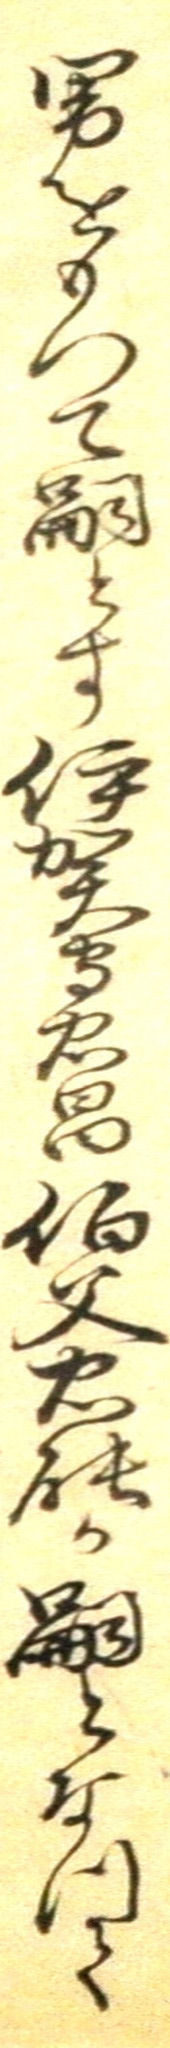男をもつて嗣とす伊賀守忠昌伯父忠能か嗣となつて
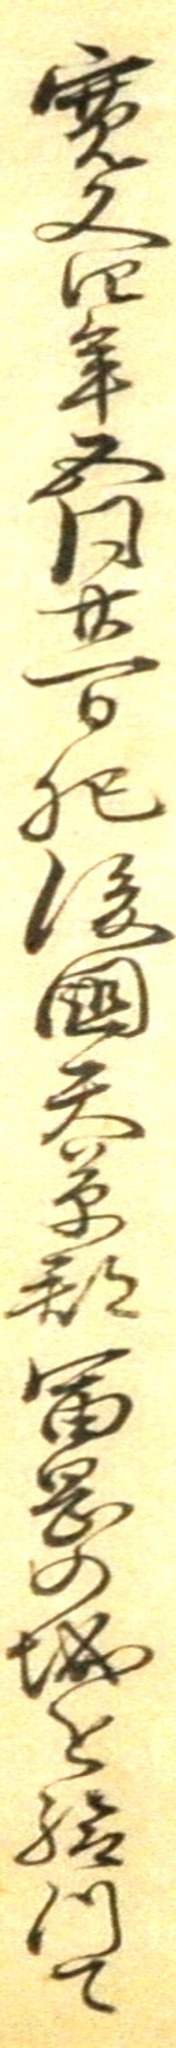寛文四年五月廿一日肥後国天草郡富岡の城を給つて
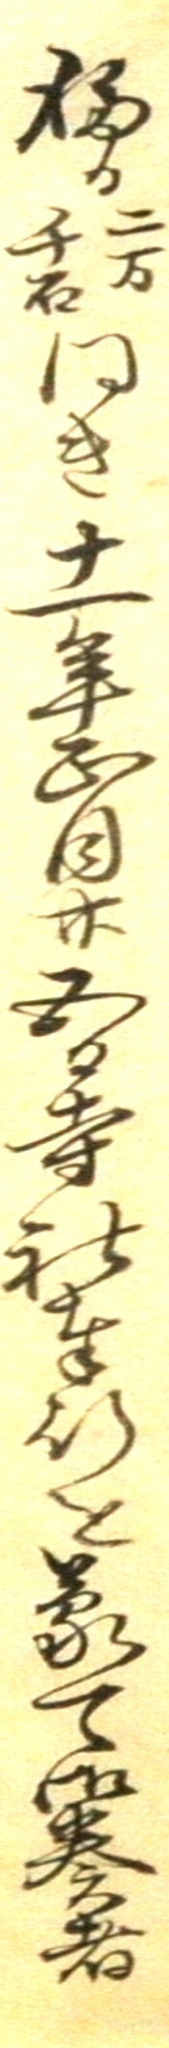移る二万千石同き十一年正月廿五日寺社奉行を蒙て御奏者
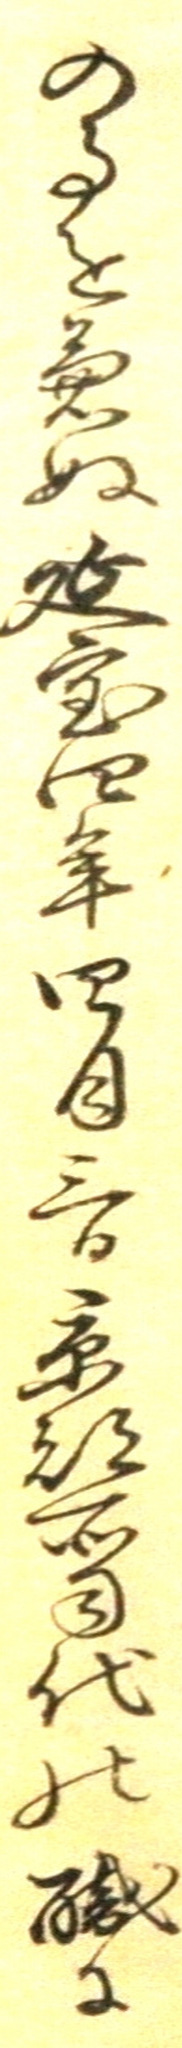の事を兼ぬ延宝四年四月三日京都所司代の職に

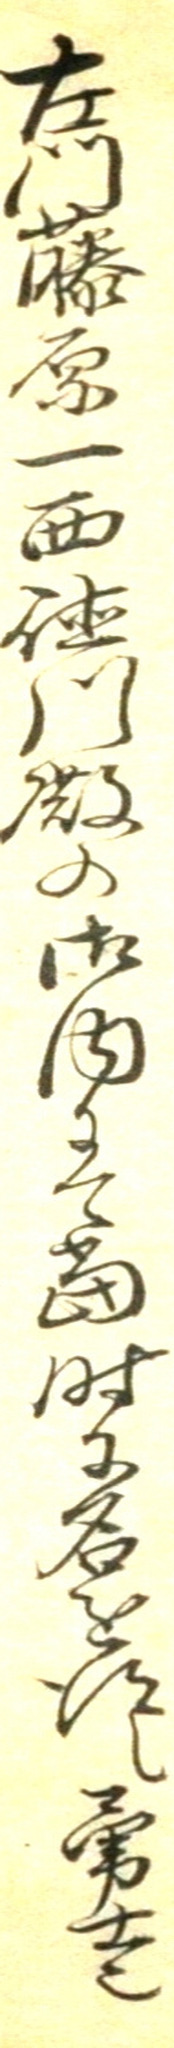左門藤原一西徳川殿の御内にて当時に名を得し勇士也
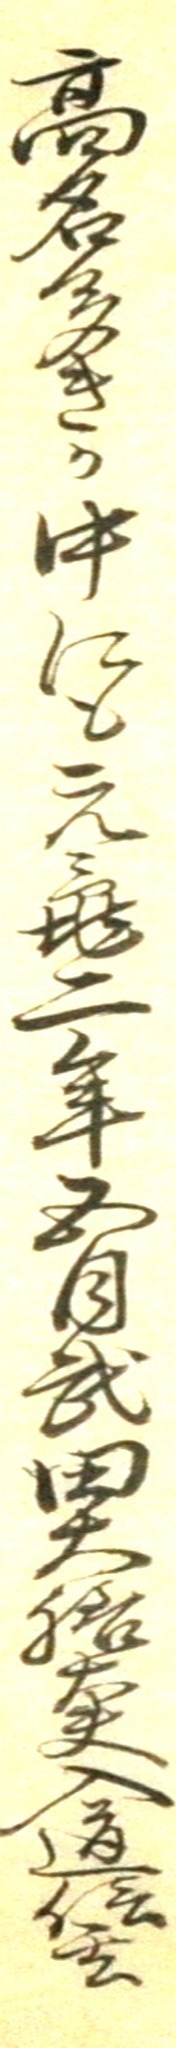高名多きか中にも元亀二年五月武田大膳大夫入道信玄
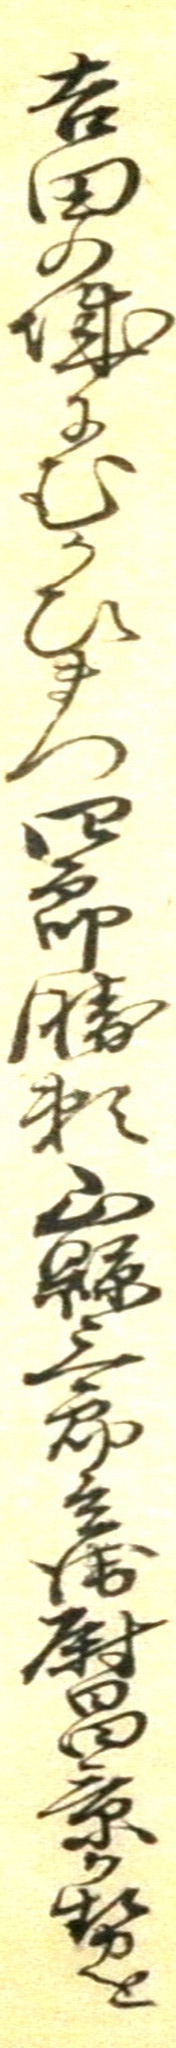吉田の城にむかひまつ四郎勝頼山縣三郎兵衛尉昌景か勢を
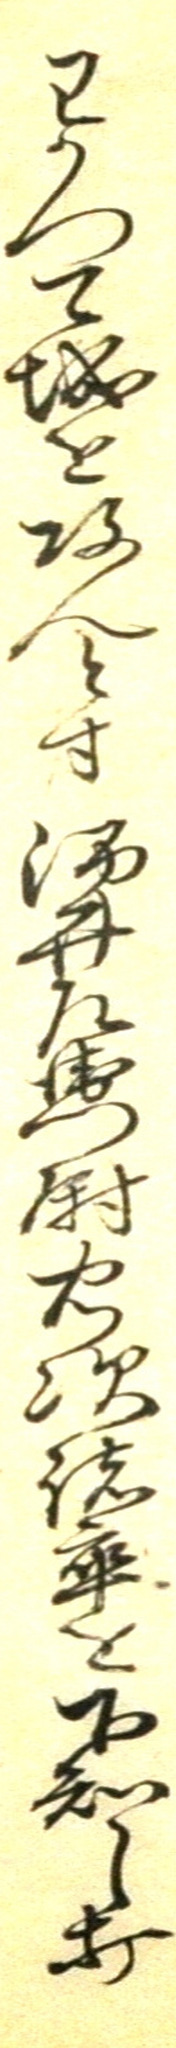わかつて城を攻んとす酒井左衛門尉忠次諸卒を下知し打
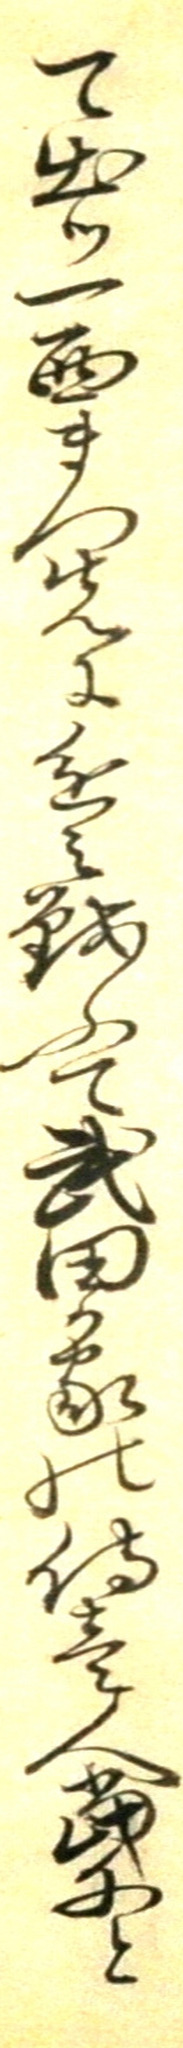て出ッ一西まつ先に進み戦ふて武田か家の侍壱人当にと

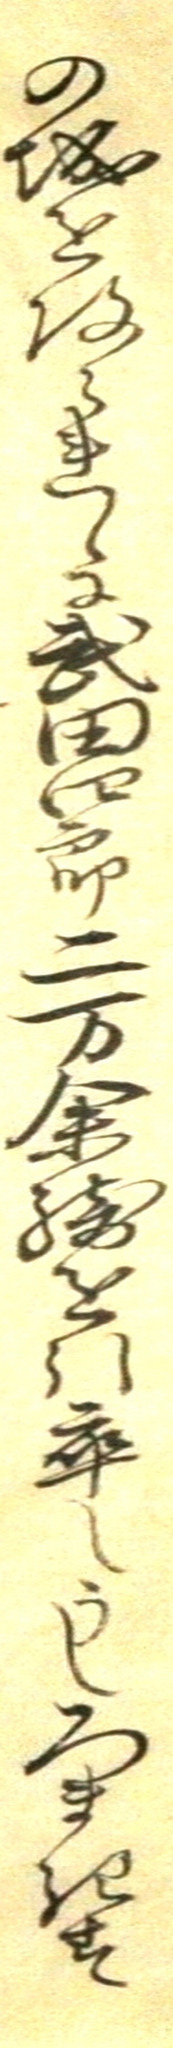の城を攻られしに武田四郎二万余騎を引率しうしろまきす
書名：藩翰譜（四・下）
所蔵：伊那市立高遠町図書館・合同会社AMANE
